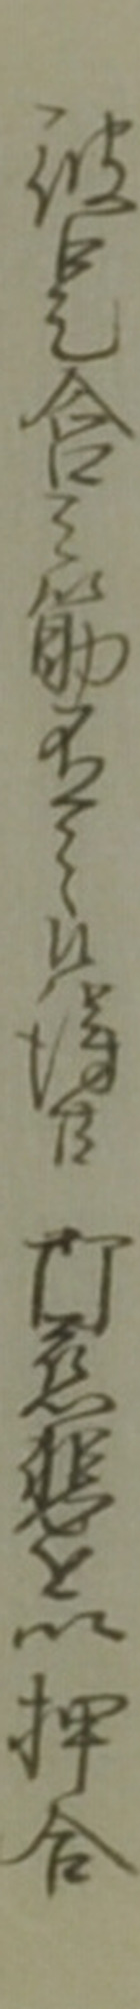彼是含之筋有之候得共御慈悲を以押合
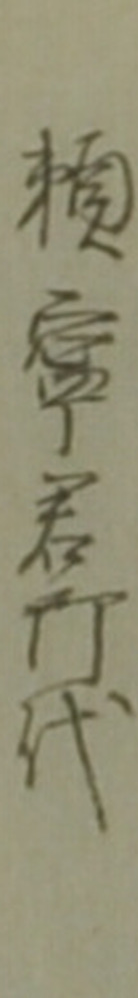頼寧君御代
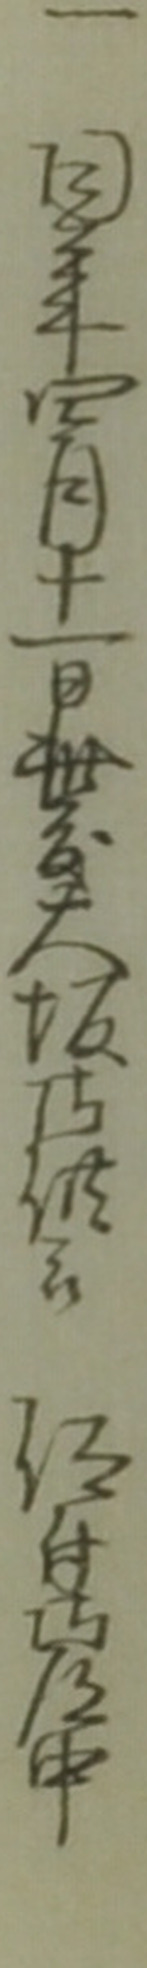一同年四月十一日此度大坂御供被仰付御道中
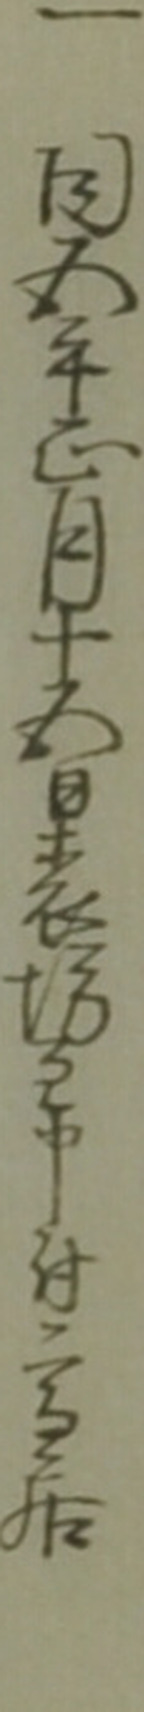一同五午正月十五日表坊主申付高居
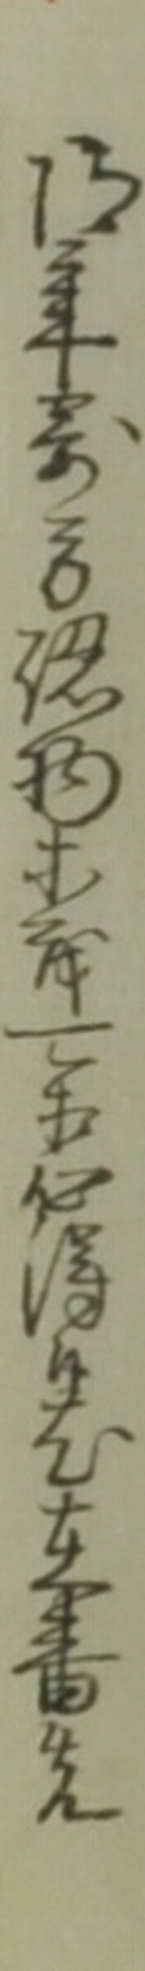御年寄方認物等茂可相心得候尤在番先
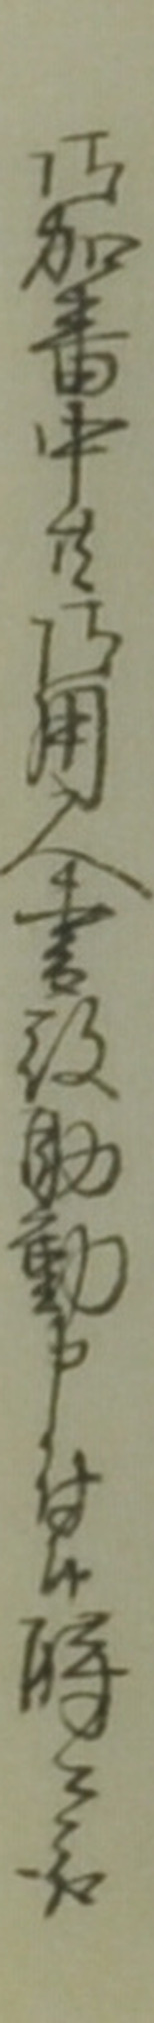御加番中共御用人書役助勤申付候時ニ取

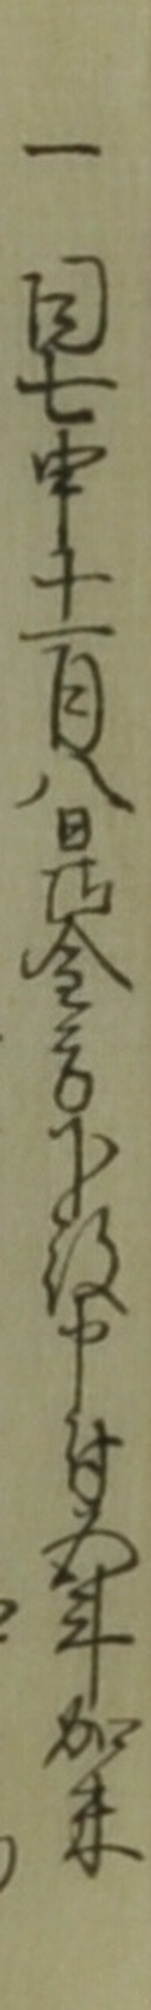一同七申十一月八日御金方下役申付五斗加米
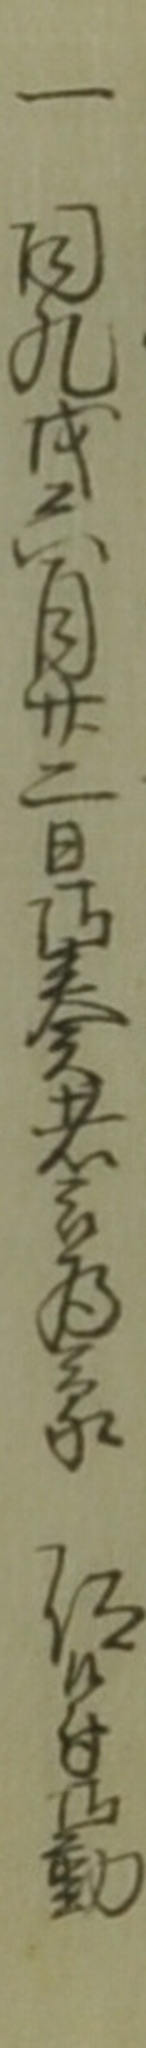一同九戌六月廿二日御奏者被為蒙仰候付御勤
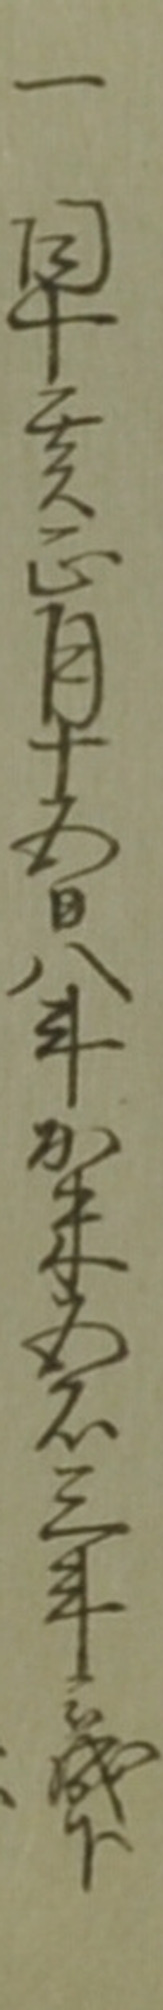一同十亥正月十五日八斗加米五石三斗被成下
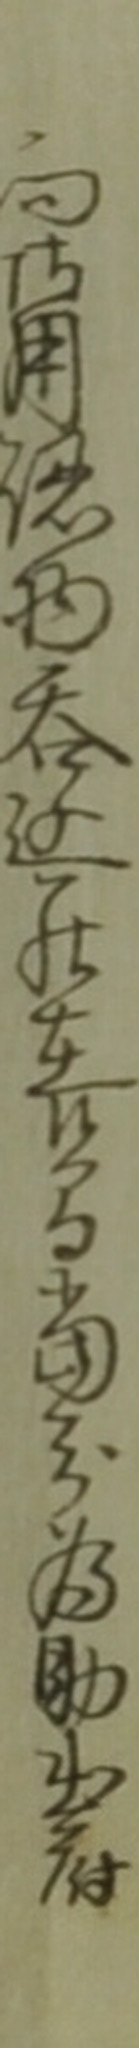向御用認物呑込罷在候間当分為助出府
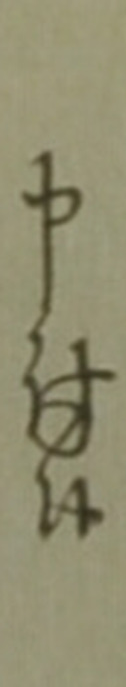申付候
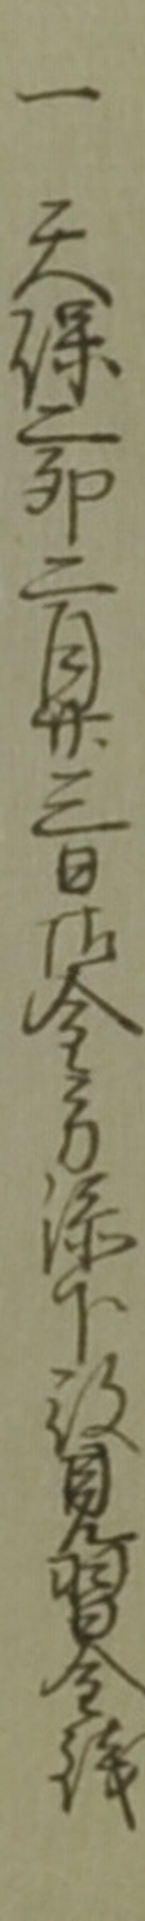一天保二卯ニ月廿三日御金方添下役見習金銭
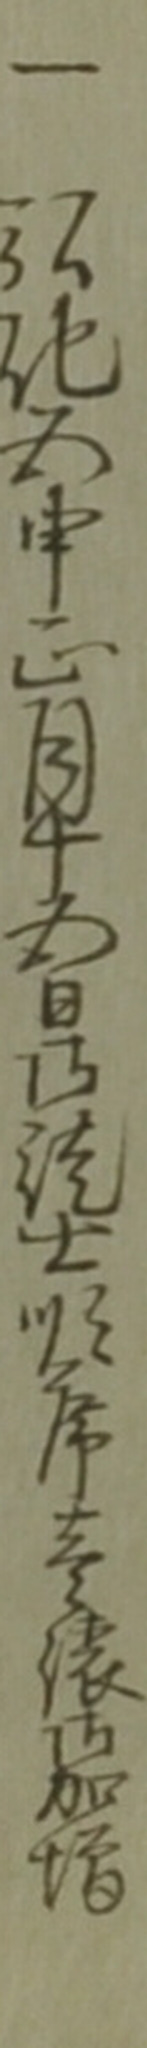一弘化五申正月十五日御徒士順席壱俵御加増
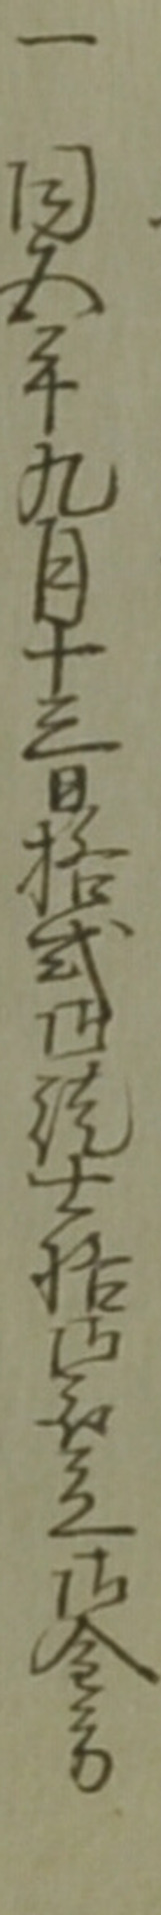一同五午九月十三日格式御徒士格御取立御金方
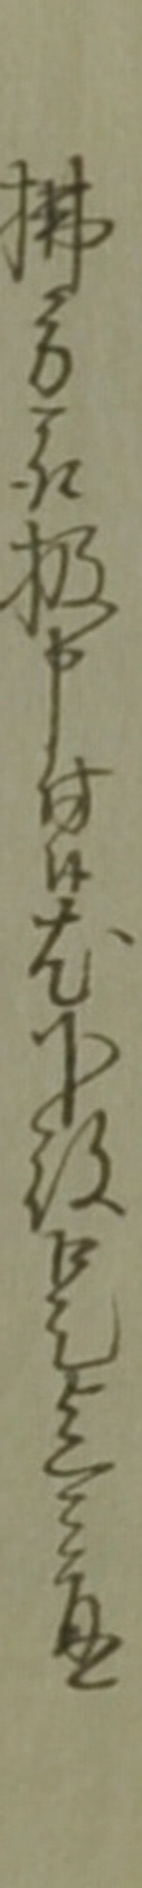払方取扱申付候尤下役是迄之通
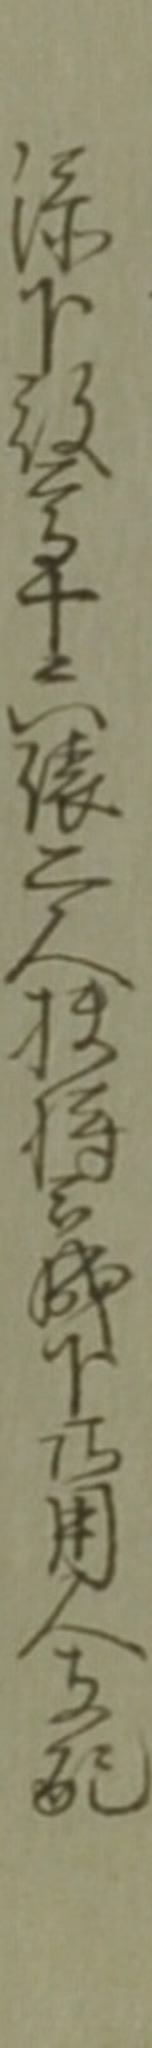添下役高十六俵二人扶持被成下御用人支配
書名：無足諸士勤仕録（八）
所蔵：伊那市立高遠町図書館・合同会社AMANE
